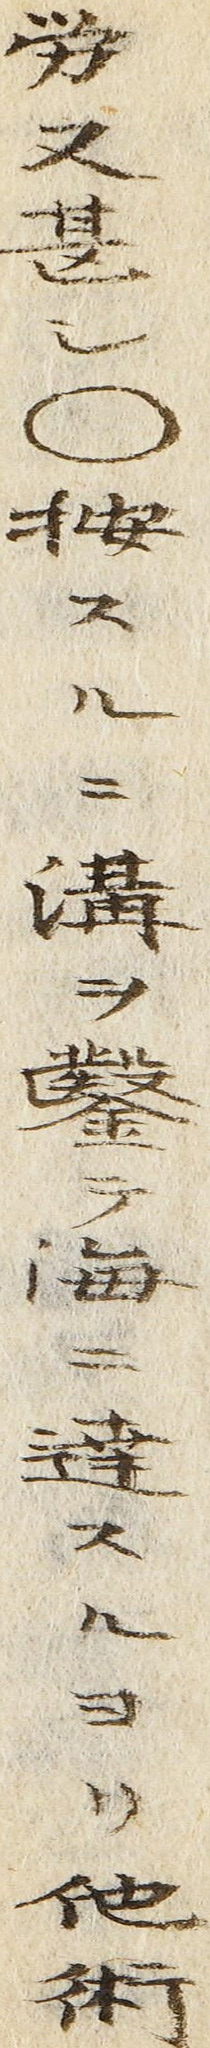労又甚シ◯按スルニ溝ヲ鑿テ海ニ達スルヨリ他術
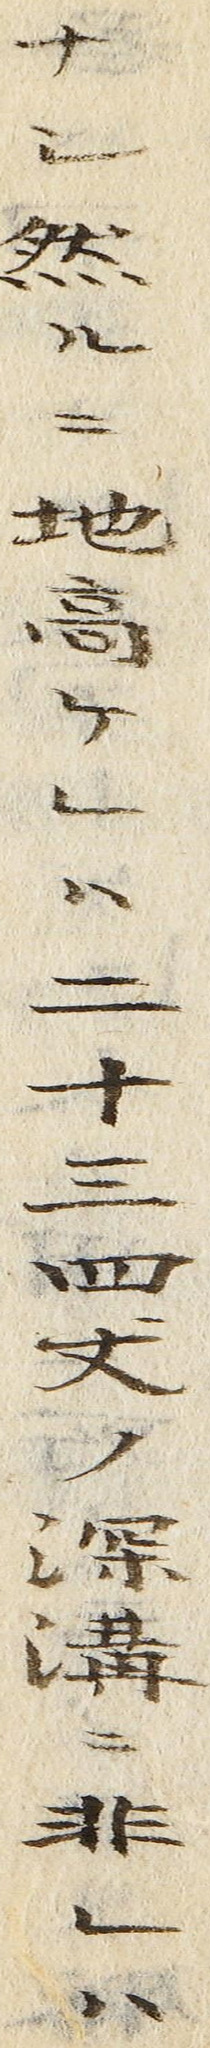ナシ然ルニ地高ケレハ二十三四丈ノ深溝ニ非レハ
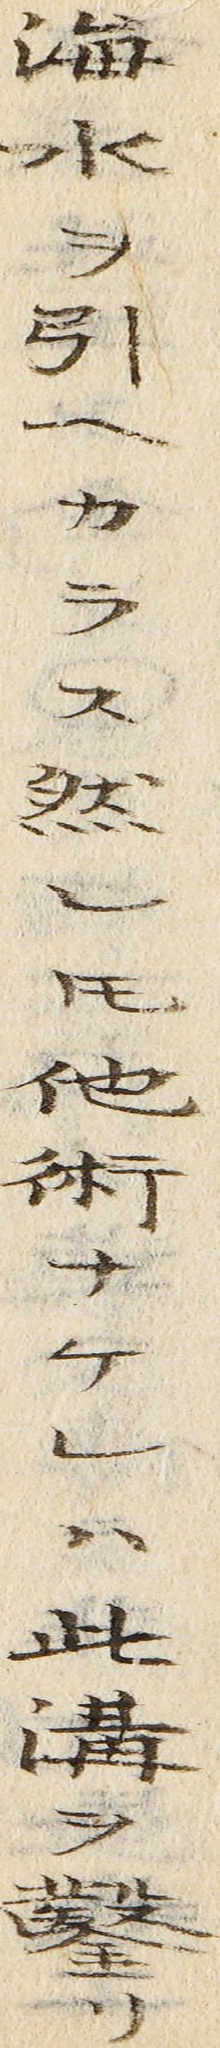海水ヲ引ヘカラス然レトモ他術ナケレハ此溝ヲ鑿リ
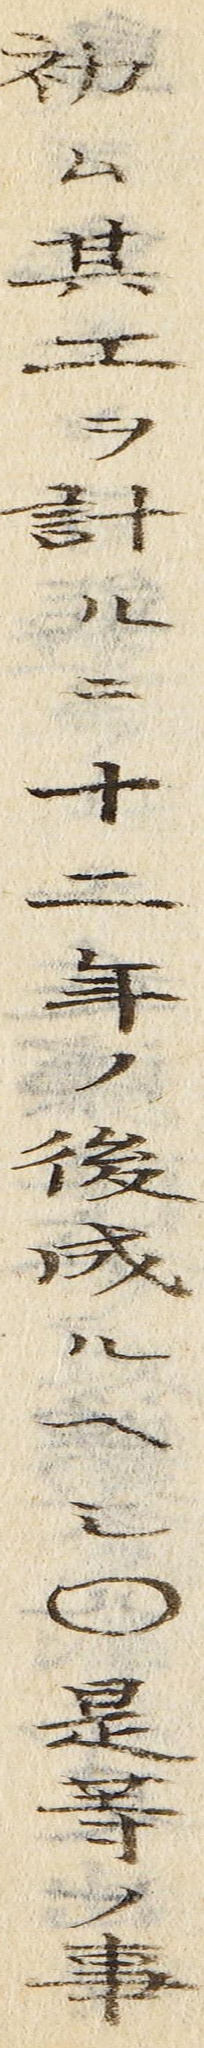初ム其工ヲ計ルニ十二年ノ後成ルヘシ◯是等ノ事
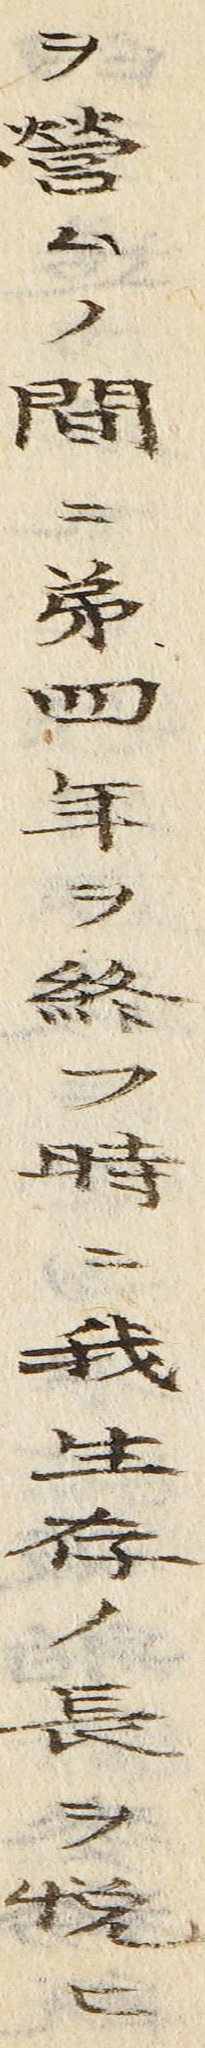ヲ営ムノ間ニ第四年ヲ終フ時ニ我生存ノ長ヲ悦ヒ
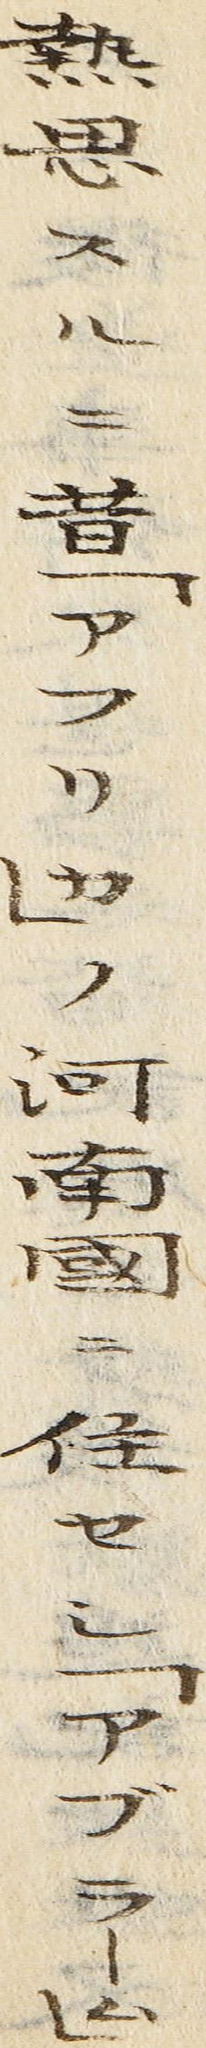熱思スルニ昔「アフリカ」ノ河南国ニ住セシ「アブラーム」
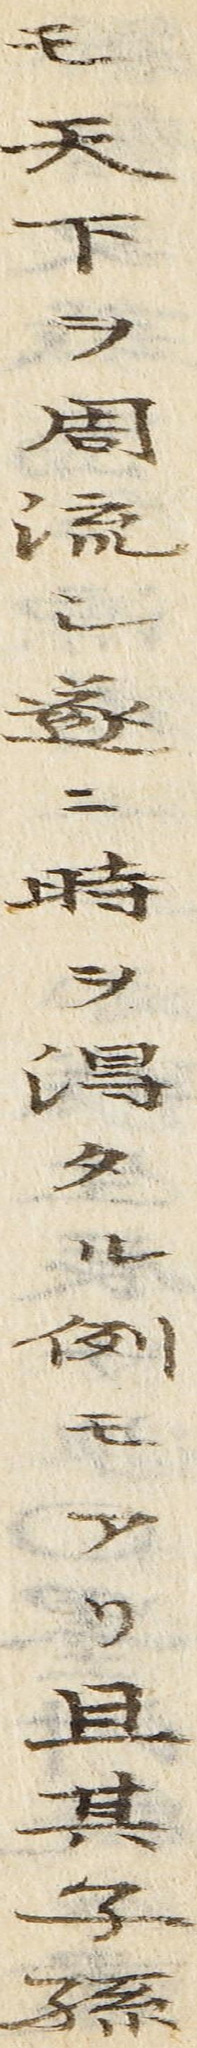モ天下ヲ周流シ遂ニ時ヲ得タル例モアリ且其子孫
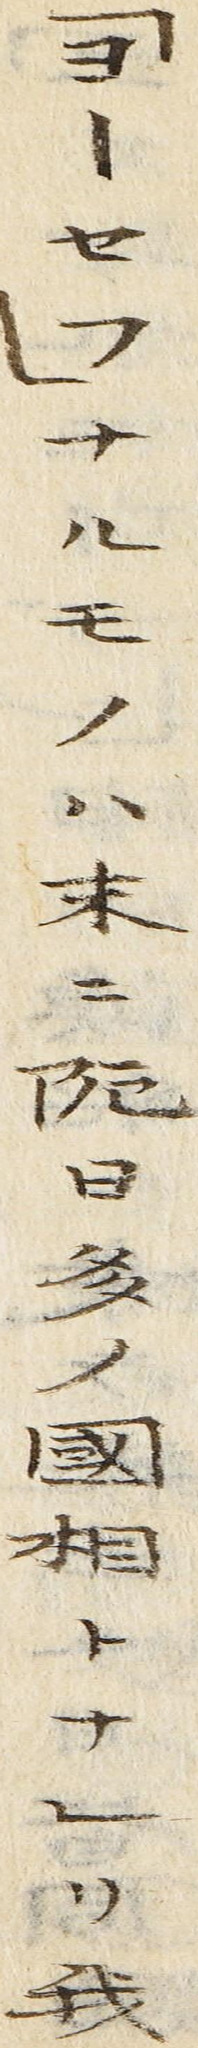「ヨーセフ」ナルモノハ末ニ阨日多ノ国相トナレリ我
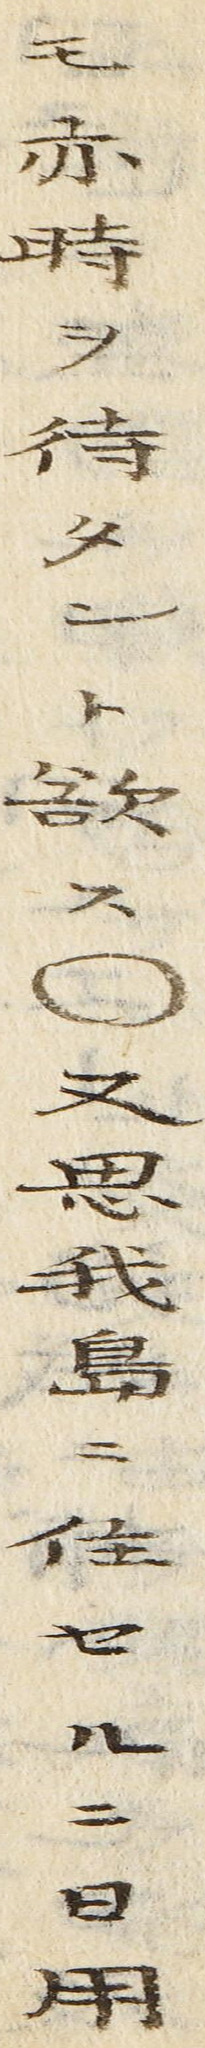モ亦時ヲ待タント欲ス◯又思我島ニ住セルニ日用
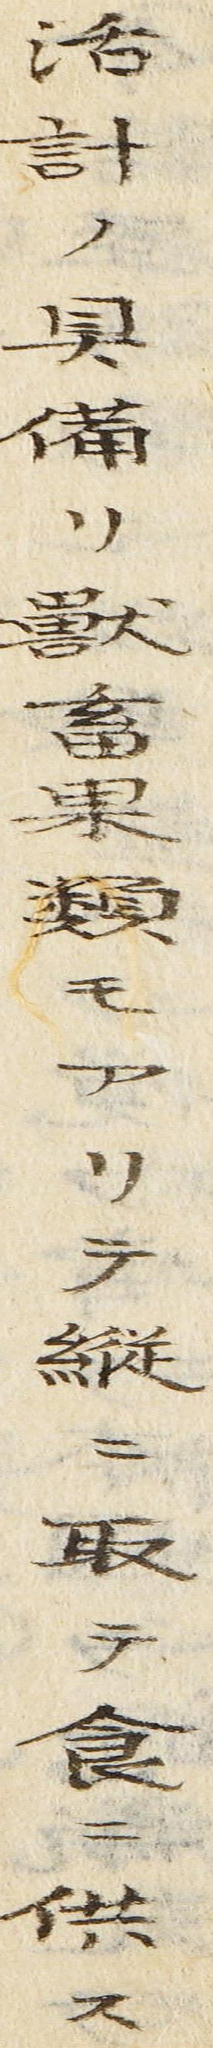活計ノ具備リ獣畜果類モアリテ縦ニ取テ食ニ供ス
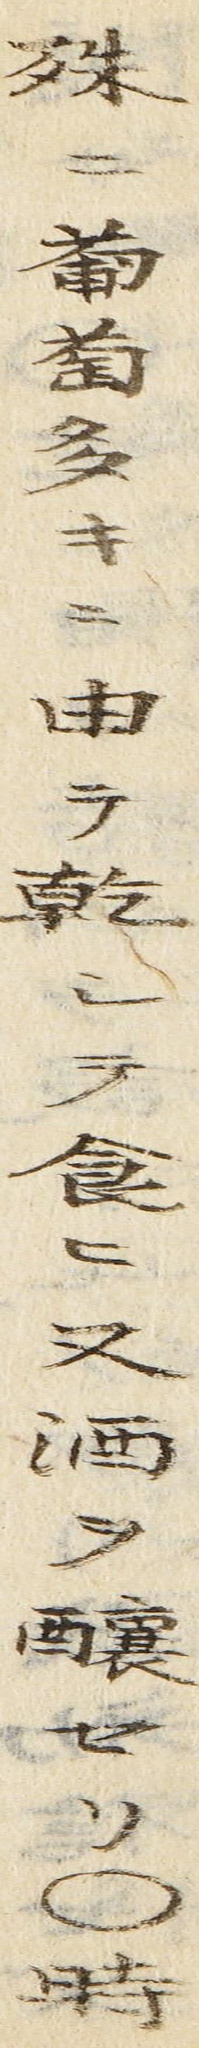殊ニ葡萄多キニ由テ乾シテ食ヒ又酒ヲ醸セリ◯時
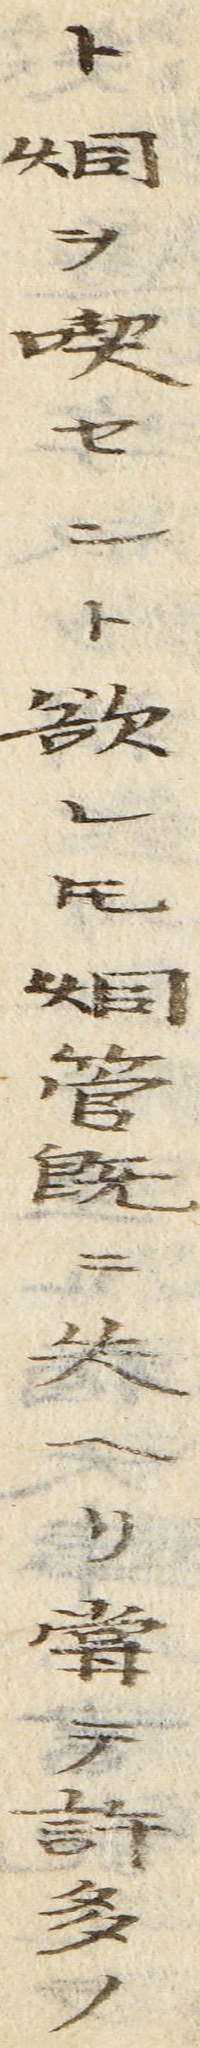ト煙ヲ喫セント欲レトモ煙管既ニ失ヘリ嘗テ許多ノ
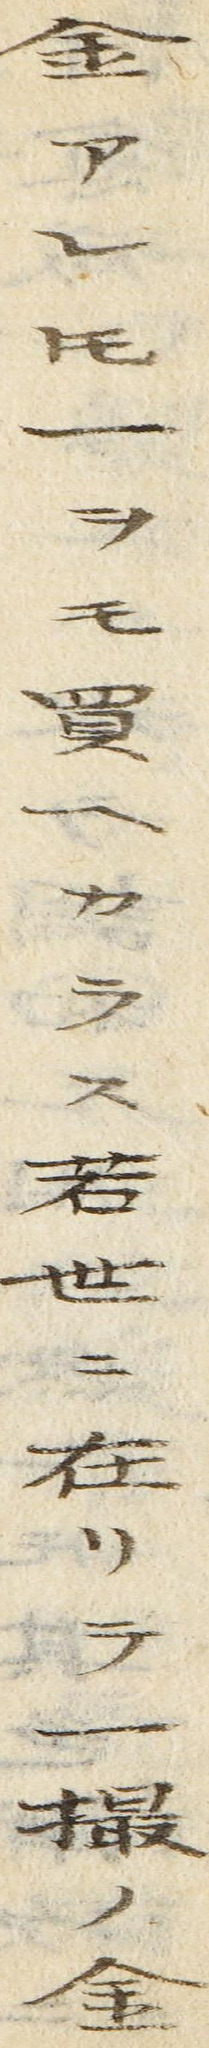金アレトモ一ヲモ買ヘカラス若世ニ在リテ一撮ノ金
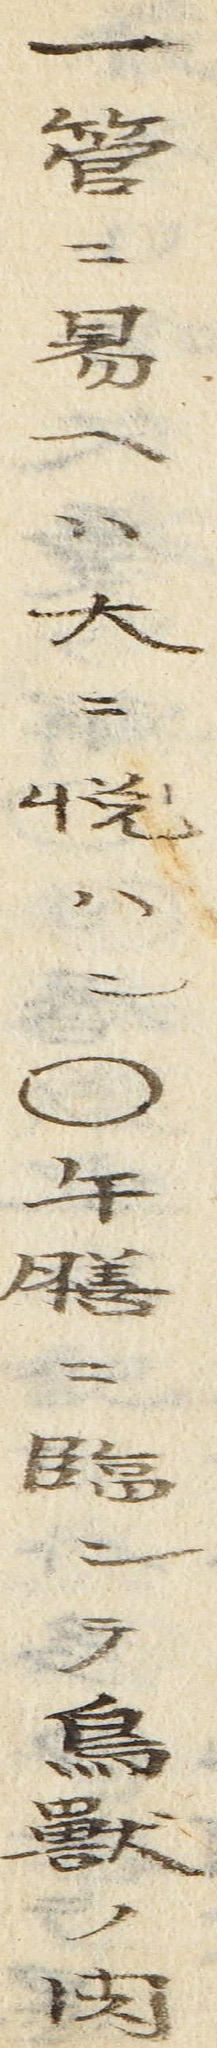一管ニ易ヘハ大ニ悦ハン◯午膳ニ臨ンテ鳥獣ノ肉
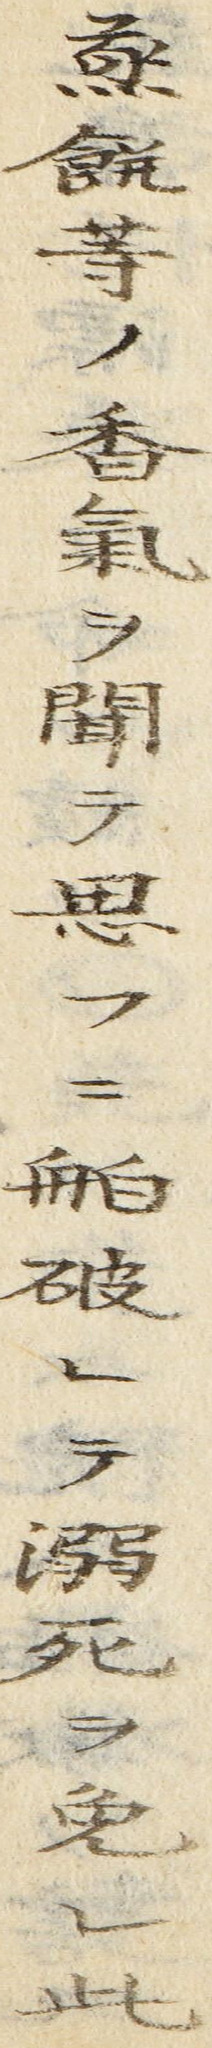蒸餅等ノ香気ヲ聞テ思フニ舶破レテ溺死ヲ免レ此

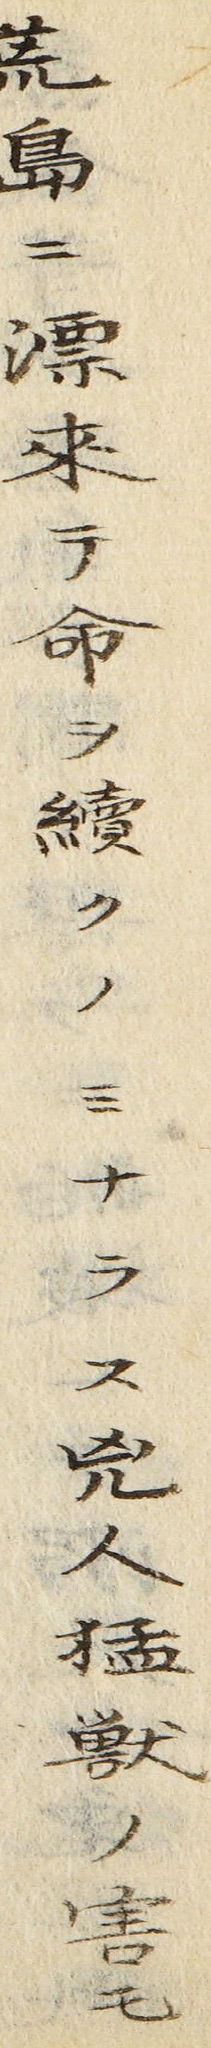荒島ニ漂来テ命ヲ続クノミナラス兇人猛獣ノ害モ
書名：漂流紀事
